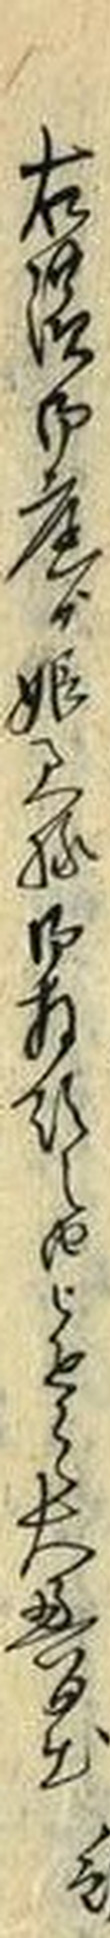右浜御庭ゟ姫君様御拝領之由被進之大奥ゟ出
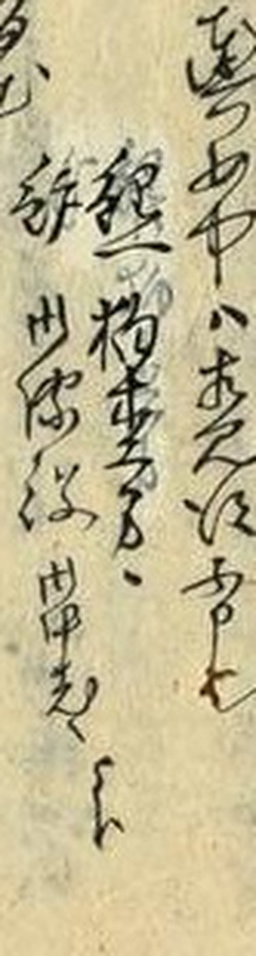魲御傅役御中老へ被下
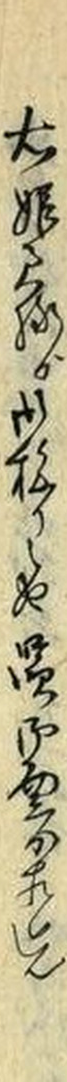右姫君様ゟ御移り候由浜御殿ゟ相廻ㇽ
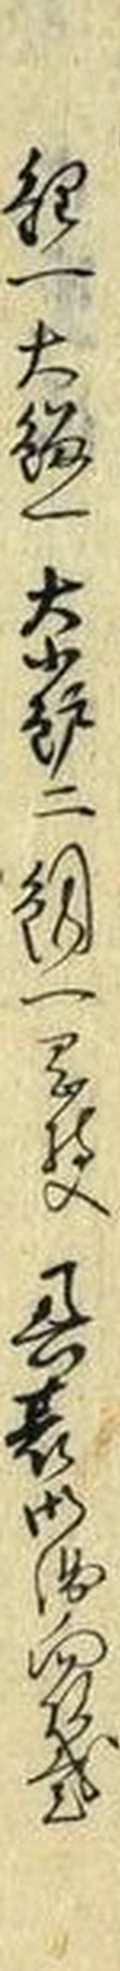鯉一大鯔一大小魲二鯛一岡持入奥表御側向頂戴
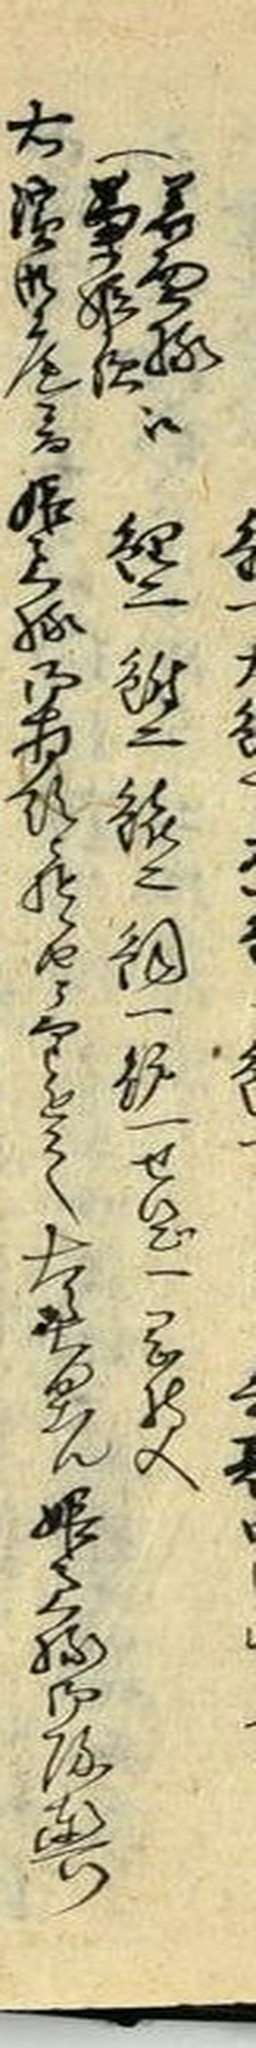右浜御庭ニ而姫君様御拝領被遊候由ニ而被進之大奥ゟ出ㇽ姫君様御帰輿
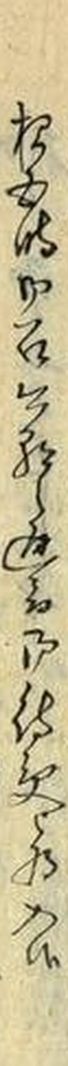夜五時御召今朝之通ニ而御待受被為入候
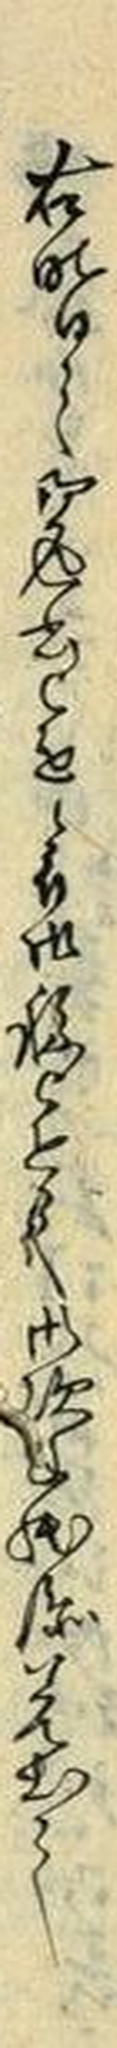右昨日之御返書被進候ニ付御移り被進之御次手紙添差出之
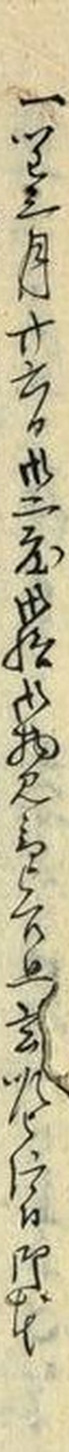一閏三月廿六日御二度御膳御物見ニ而被召上玄順被仰付御本
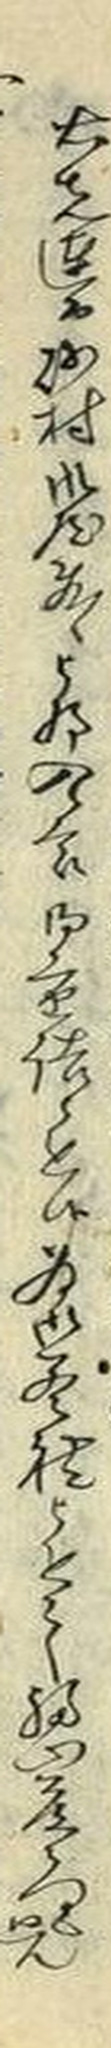右先達而砂村御屋敷へ被為入候節御重詰被進候為御答礼被進之福山藤右衛門迄廻ㇽ
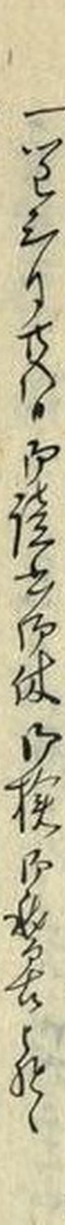一閏三月廿八日御読書御休御槍御稽古被遊候
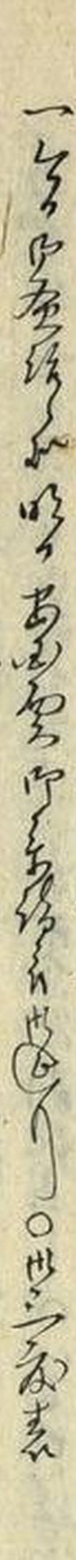一今日御灸治候処明日安国殿御参詣ニ付御延引〇御三度表
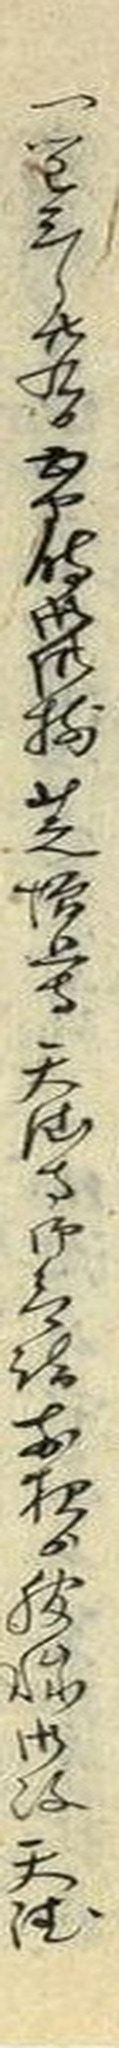一閏三月廿九日五半時御供揃芝増上寺天徳寺御参詣前夜ゟ服穢御改天徳
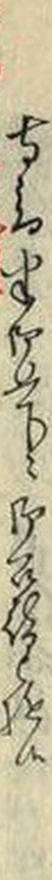寺ニ而半御上下ニ御召替被遊候
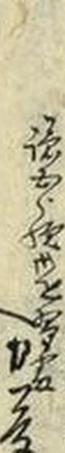謙五郎様御近習番
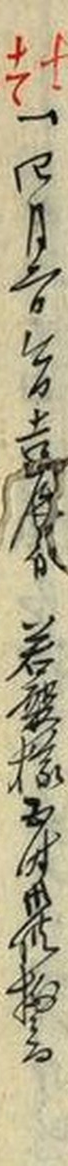一四月二日今日吉辰ニ付若殿様五時御供揃ニ而
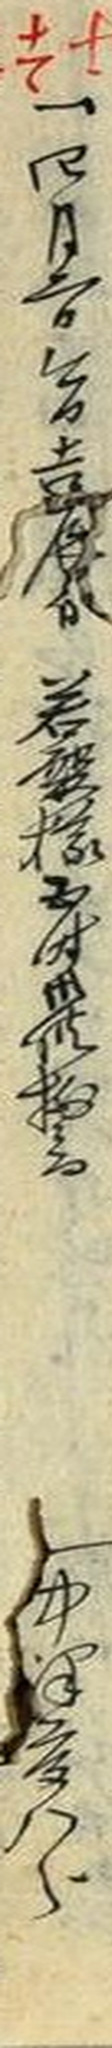一四月二日今日吉辰ニ付若殿様五時御供揃ニ而
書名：少傅日録抄（斉承付側向頭取日記、在府）
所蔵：福井県文書館 Fukui Prefectural Archives
